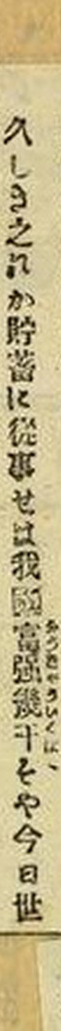久しき之れか貯蓄に従事せは我国富強幾干そや今日世
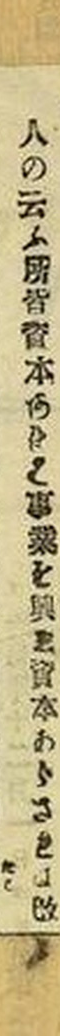人の云ふ所皆資本あれは事業を興し資本あらされは改
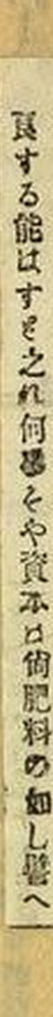良する能はすと之れ何事そや資本は尚肥料の如し譬へ

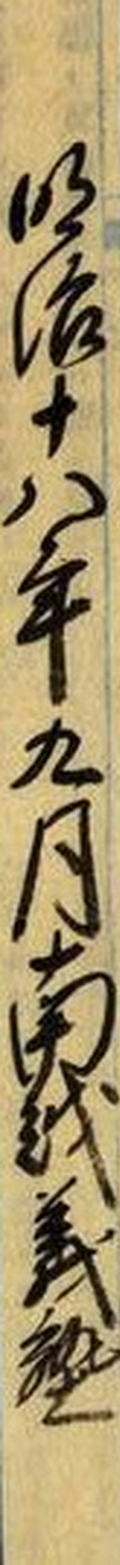明治十八年九月南越義塾
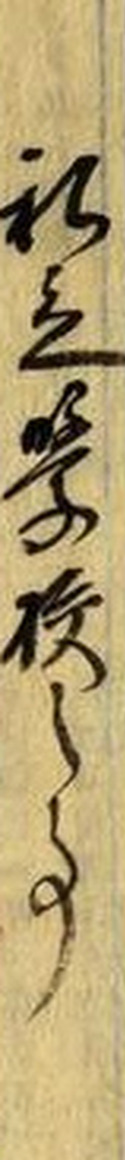私立学校之事
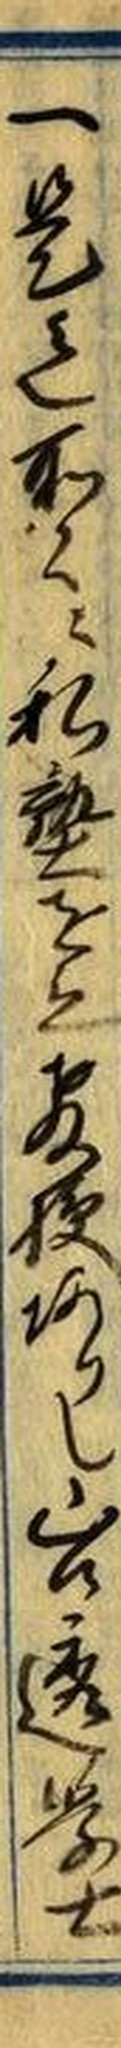一是迄所々に私塾を立教授ありし山口透学士
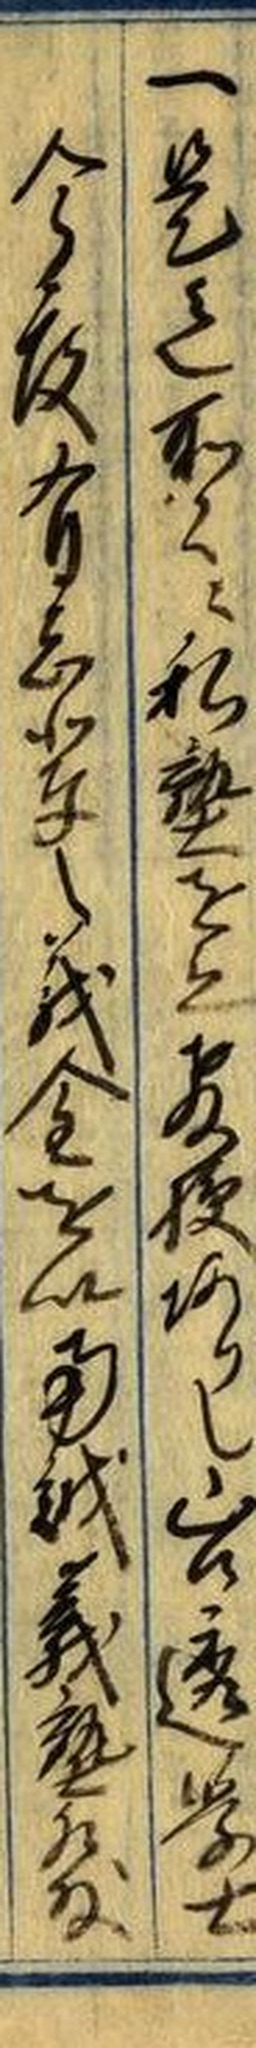今度有志輩之義金を以南越義塾発
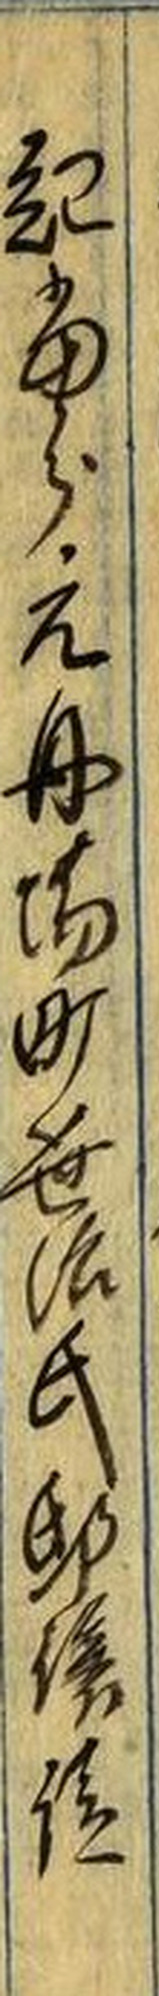起当分元舟場町笹治氏邸譲請
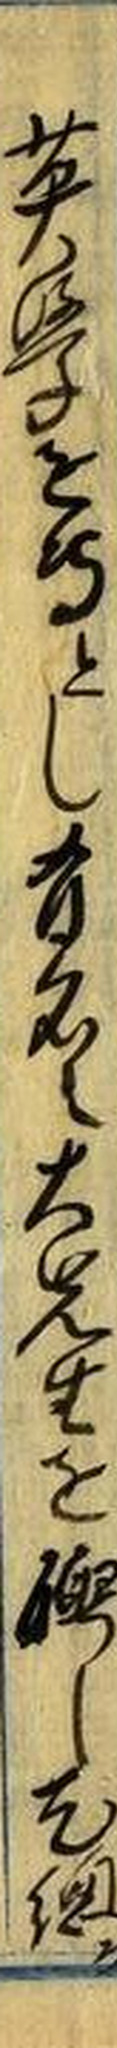英学を専とし有名之大先生聘し尤総而
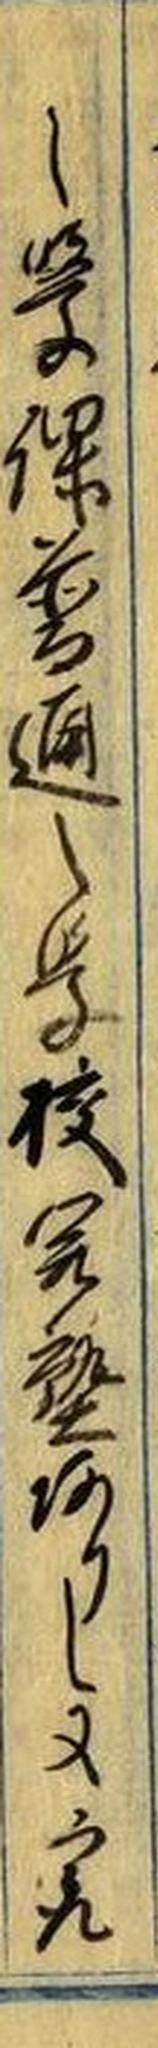之学課普通之学校開塾ありし又最
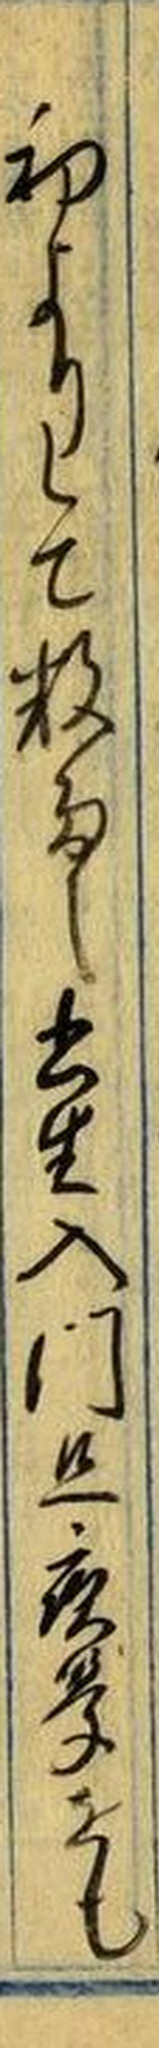初よりして数多書生入門且夜学をも
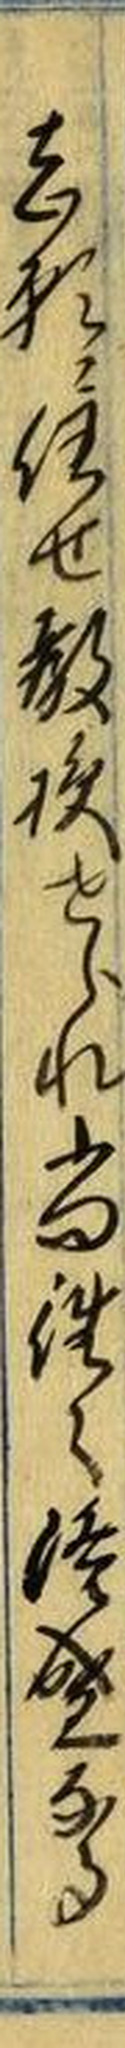志願に任せ教授せられ尚往々隆盛なる
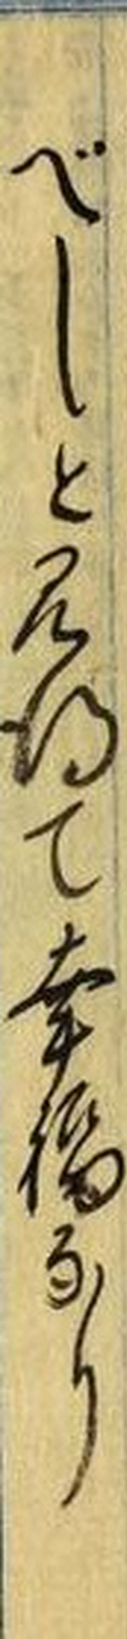べしと見得て幸福なり
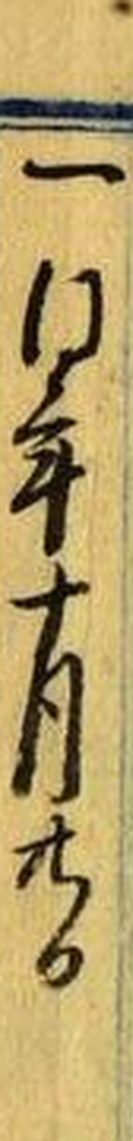一同年十月廿日
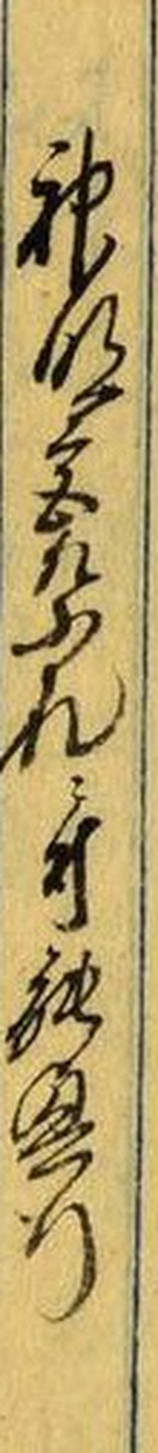神明宮祭礼に付能興行
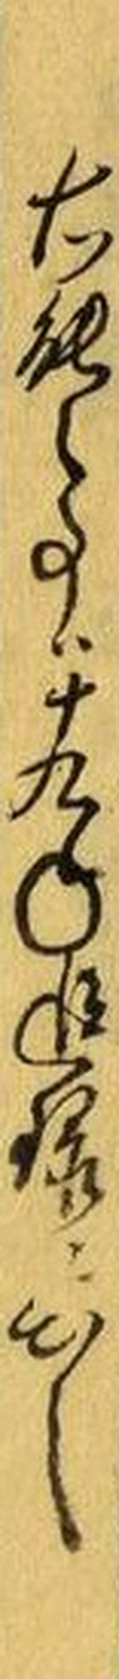右能之事は十九年追録に出之
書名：温古集 五巻
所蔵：福井県文書館 Fukui Prefectural Archives
